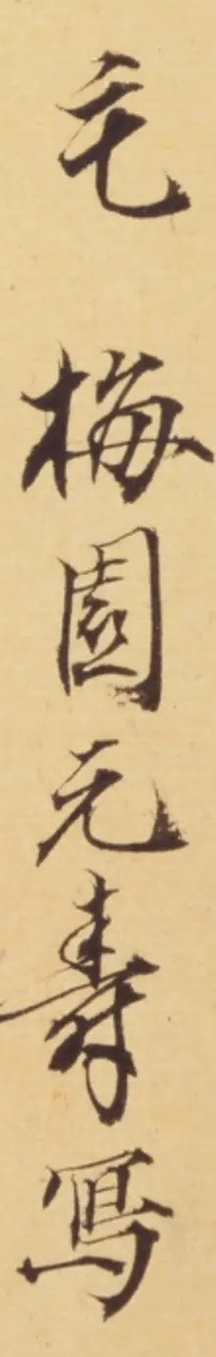毛梅園元壽寫
